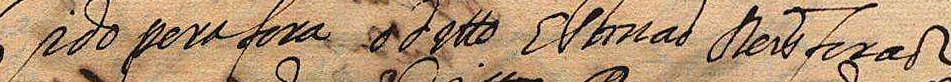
E ido pera fora o ditto Esteuaõ Rois̄ foraõ
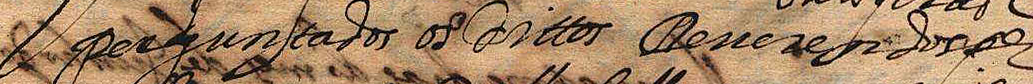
perguntados os dittos Reuerendos p.es
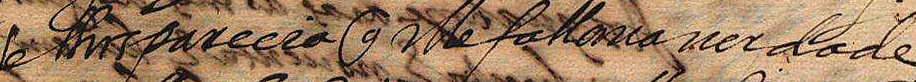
se lhes parecia q̄ elle fallaua uerdade
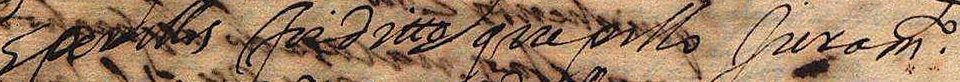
E per elles foi ditto que pello Juram.to
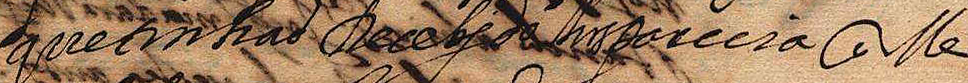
que tinhaõ Recebjdo lhes parecia q̄ elle
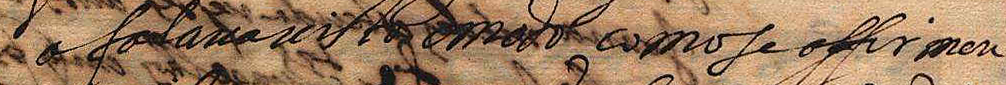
o falaua uisto o modo como se affirmou
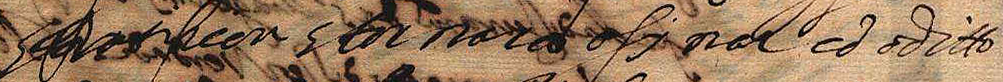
E Ratificou E tornaraõ asynar cō o ditto
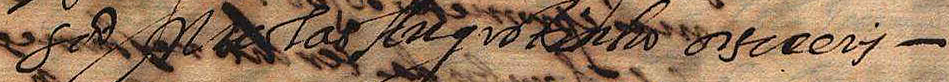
sor̄ nicolao Augostinho o escrevj -
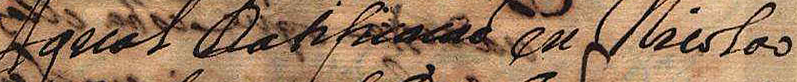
A qual Ratificaçaõ eu Nicolao
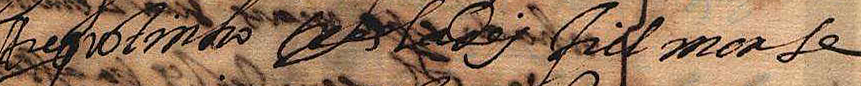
Augostinho tresladej fielmente
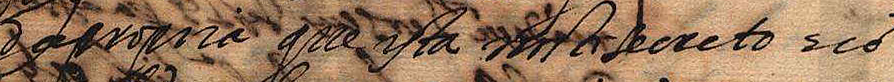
da propria que esta neste secreto E cō
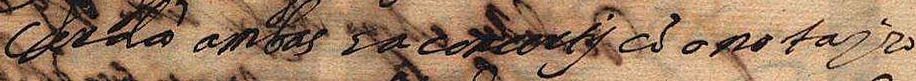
cordaõ ambas E a concertej cō o notajro
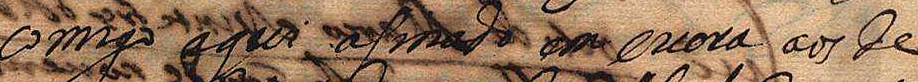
comigo aqui asinado em euora aos de
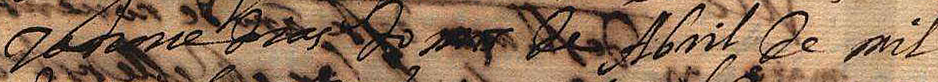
zanoue dias do mes de Abril de mil
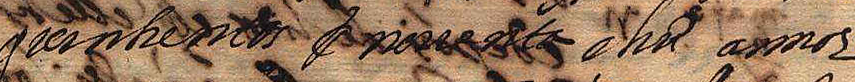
e quinhentos e nouenta e hū annos
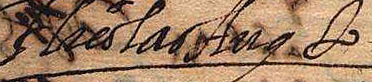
Nicolao Augto
